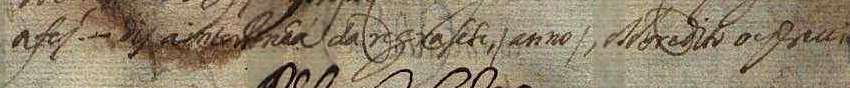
a fes. - dis a interlinha da regra / etc, / anno /, o sobredito o escreui
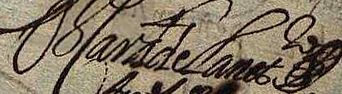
O Card̄L de Lanctro
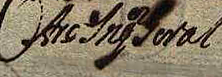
Arco Inq.or Geral
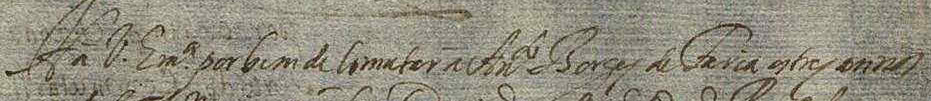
Ha V. Em.a por bem de comutar a Anto Borges de Faria os tres annos
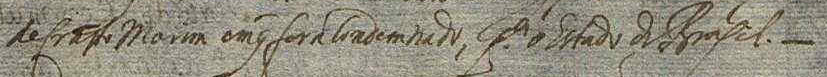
de Crasto marim em q̄ fora condemnado, p.a o Estado de Brasil.
